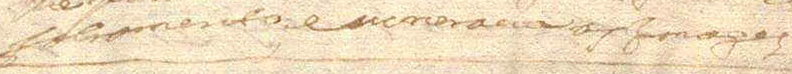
sacramento e ueneraua as Jmages
